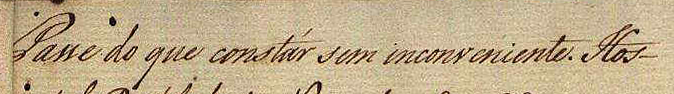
Passe do que constár sem inconveniente. Hos
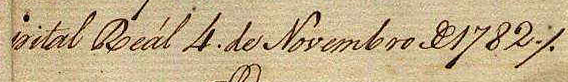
pital Reál 4. de Novembro d̄ 1782./.
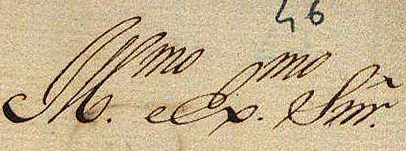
Ill.mo e Ex.mo Snr̄.
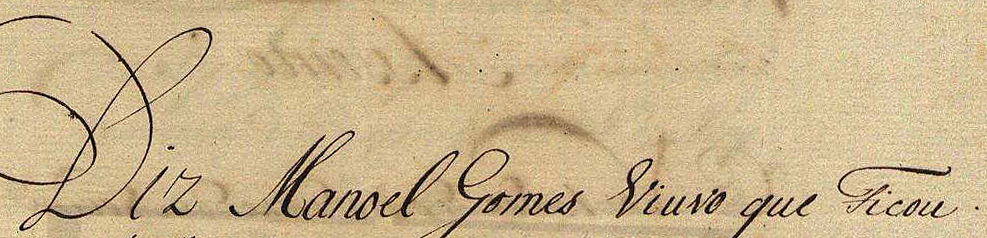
Diz Manoel Gomes Viuvo que Ficou
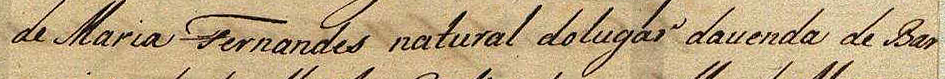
de Maria Fernandes natural do lugar da uenda de Bar
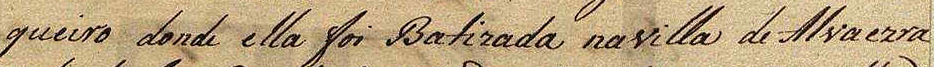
queiro donde ella foi Batizada na villa de Alvaezra
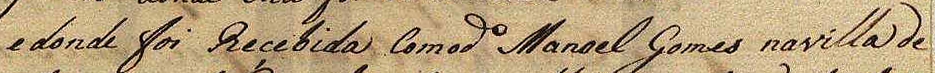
e donde foi Recebida com o d.o Manoel Gomes na villa de
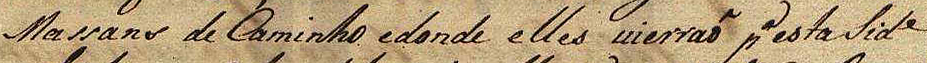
Massans de Caminho e donde elles uierraõ p.a esta Sid.e
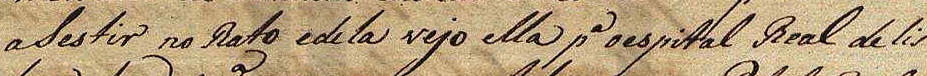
aSestir no Rato e dela vejo ella p.a o espital Real de lis
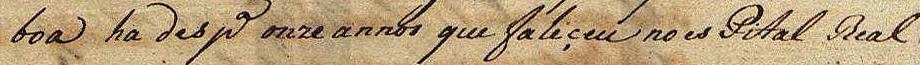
boa ha des p.a onze annos que faleceu no esPital Real
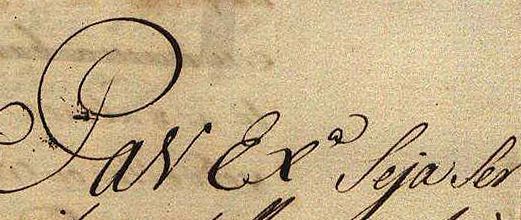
P a V Ex.a Seja ser
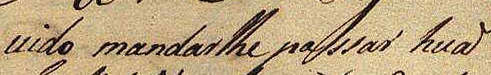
uido mandarlhe passar huā
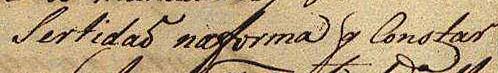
sertidaõ na forma q̄ Constar
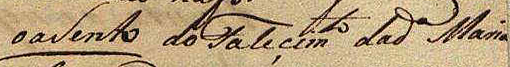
o asento do Falecim.to da d.a Maria
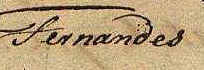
Fernandes
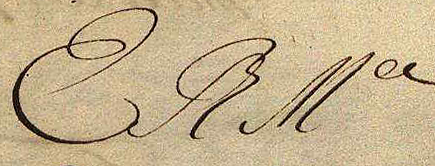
E R Mce
